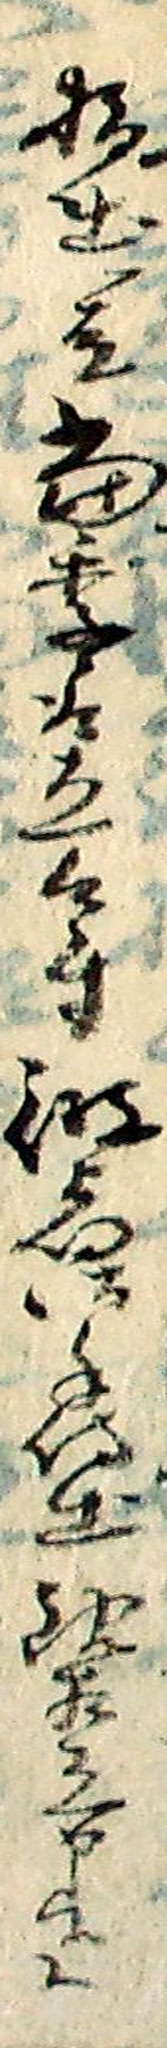指出候を当季取立候付彼者御手伝出銀相立申候以上

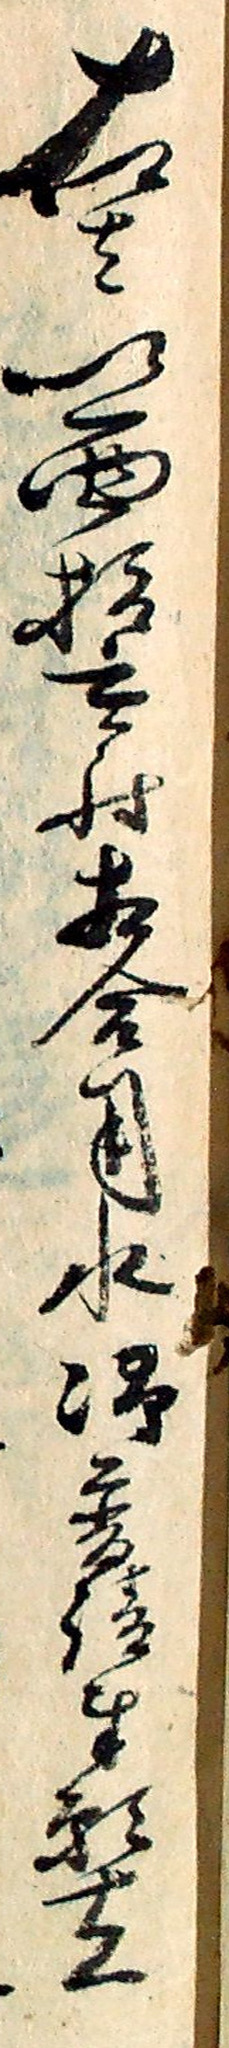右は以西拾六ヶ村相合用水御普請奉願去
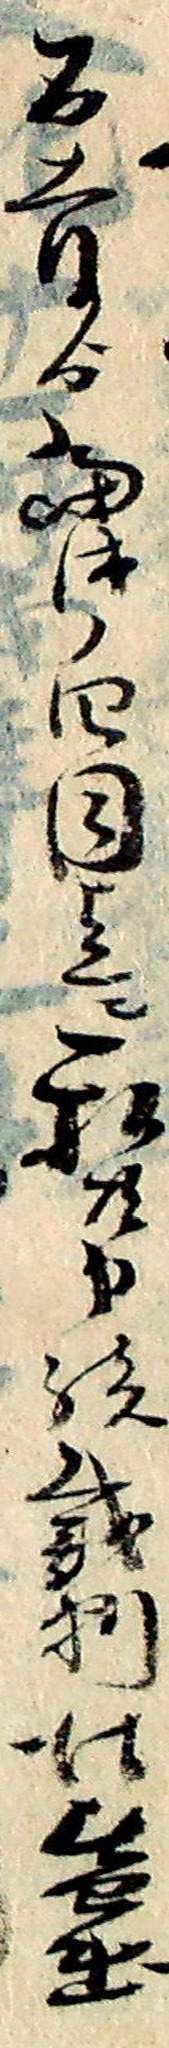酉十一月ゟ当戌ノ四月迄に私共申談截判仕皆出
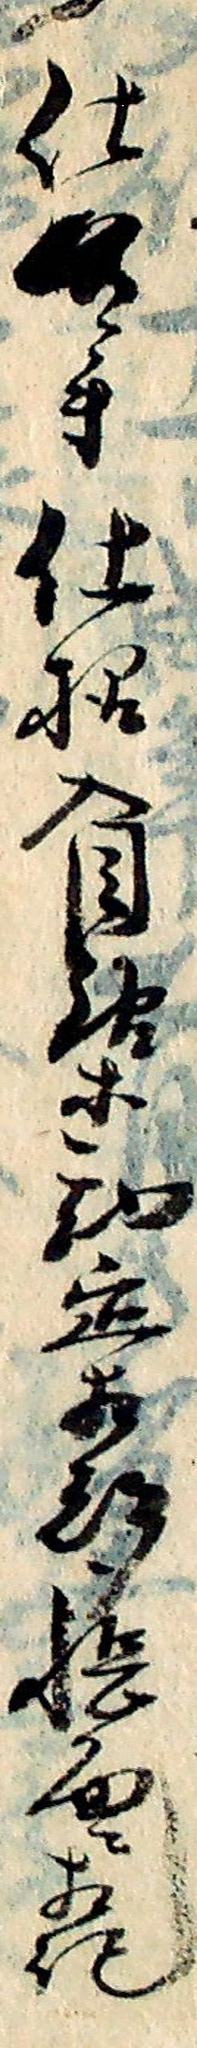仕候に付仕様入目銀等勘定相都〆帳面に相記
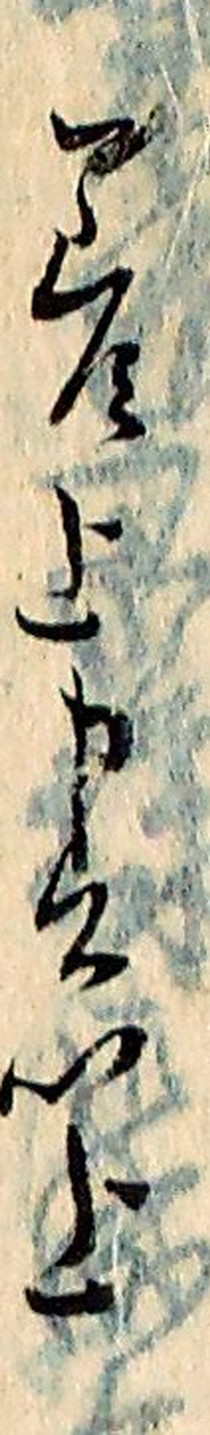差上申候以上
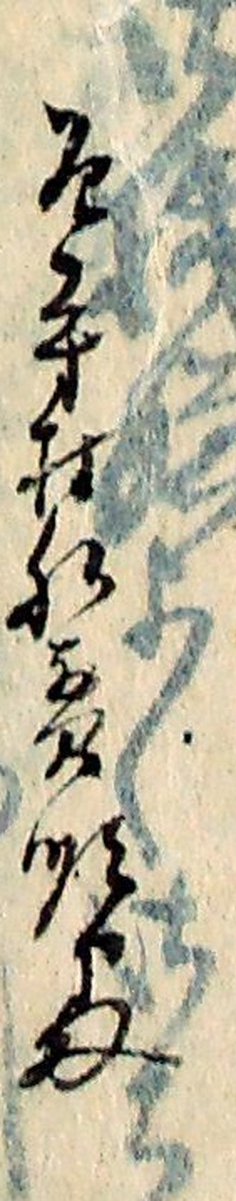尼寺村肝煎順番
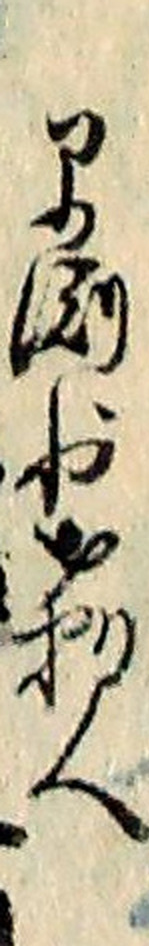早淵村才判人
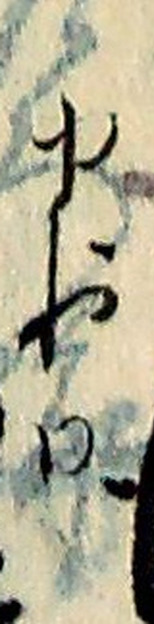中村同
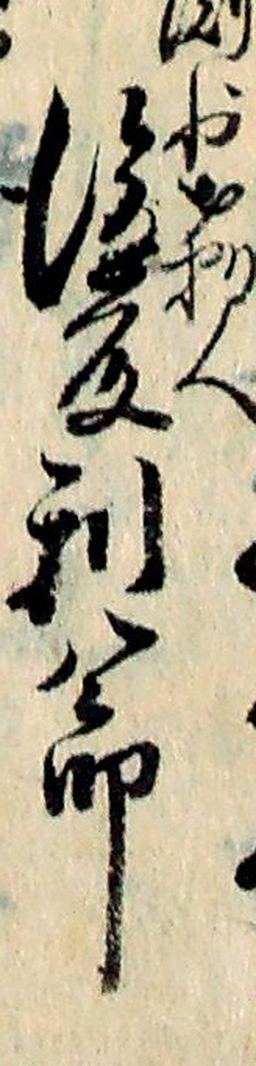後藤利八郎
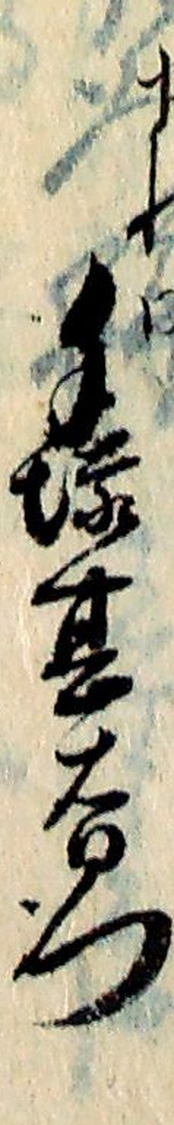手塚甚右衛門
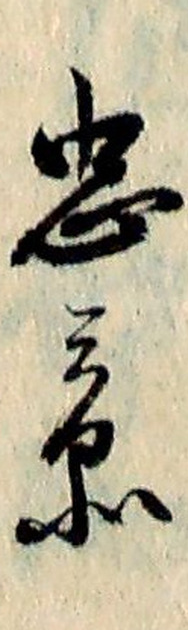忠兵衛
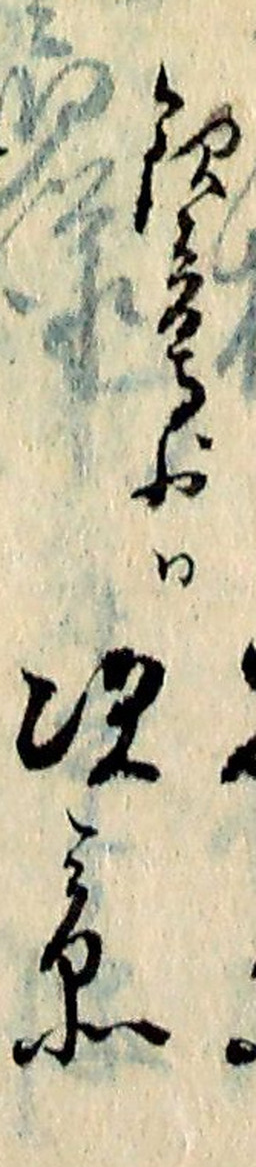次兵衛
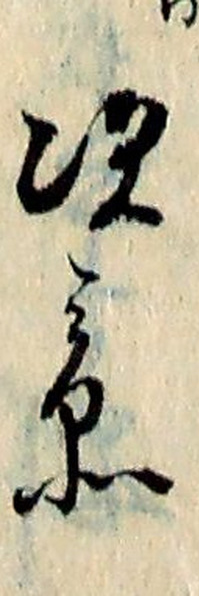次兵衛
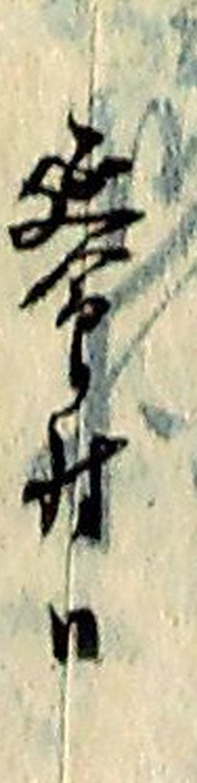延命村同
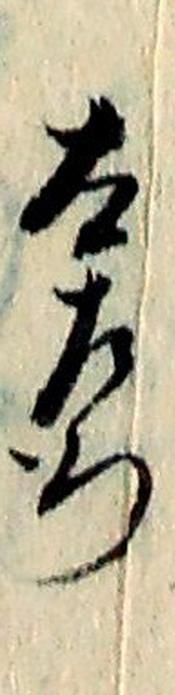太左衛門
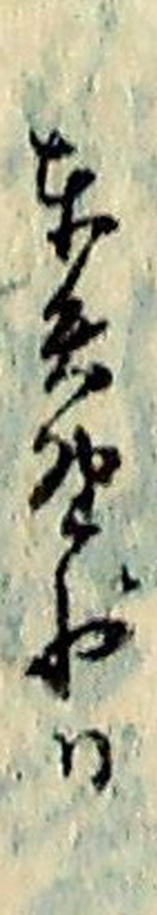東矢野村同
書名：諸御願書控(後藤氏壱番）
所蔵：鳴門教育大学 Naruto University of Education
